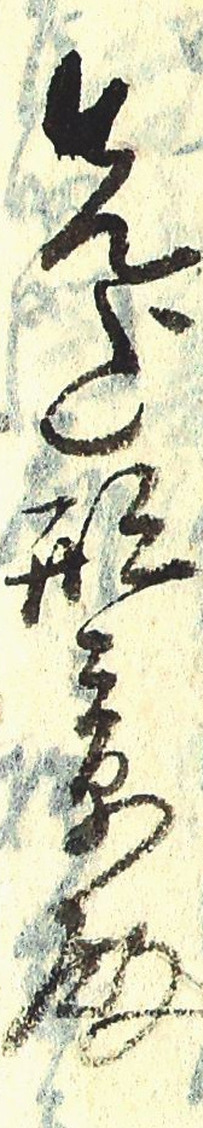先山形兵衛殿

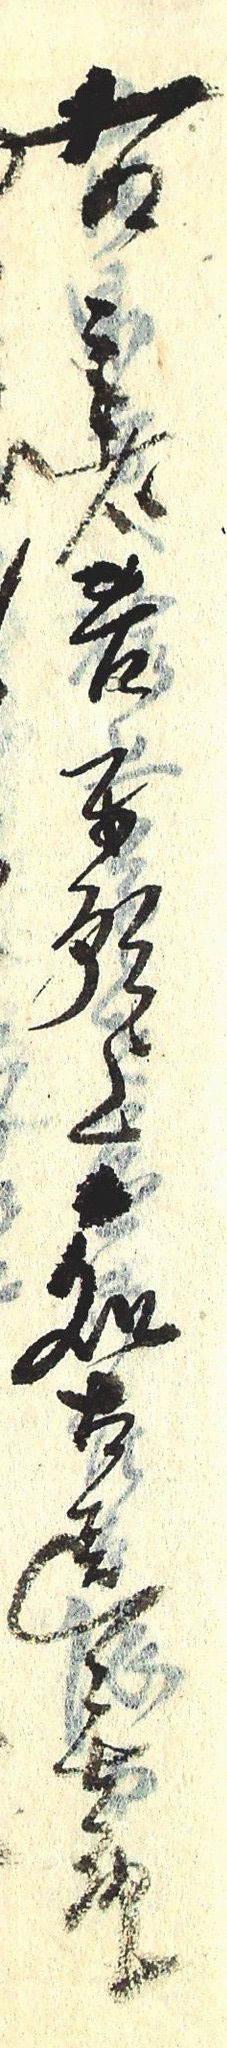右之者共奉願上候処相違無御座
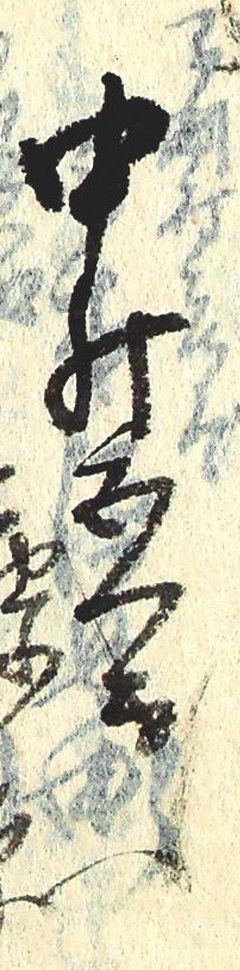中村五人与
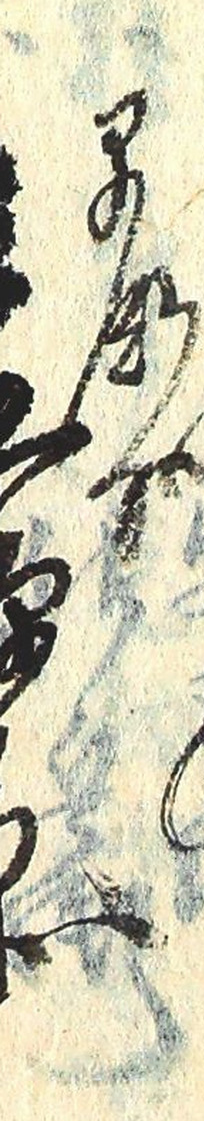早淵村
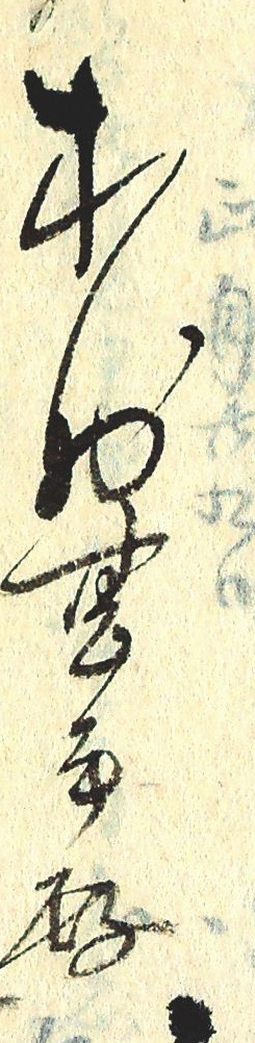木村甚平殿
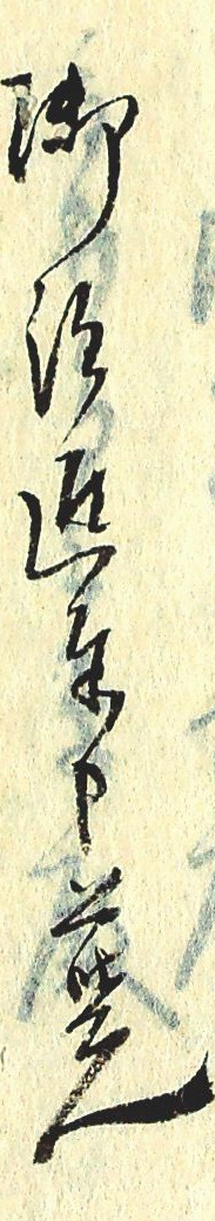御注進奉申上覚
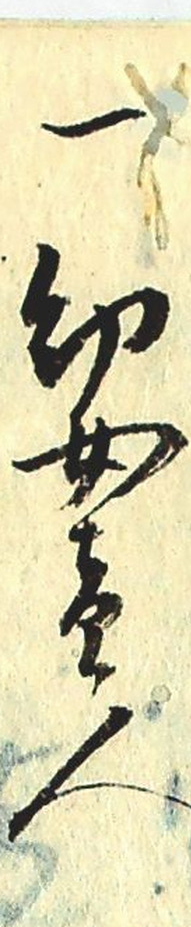一幼女壱人
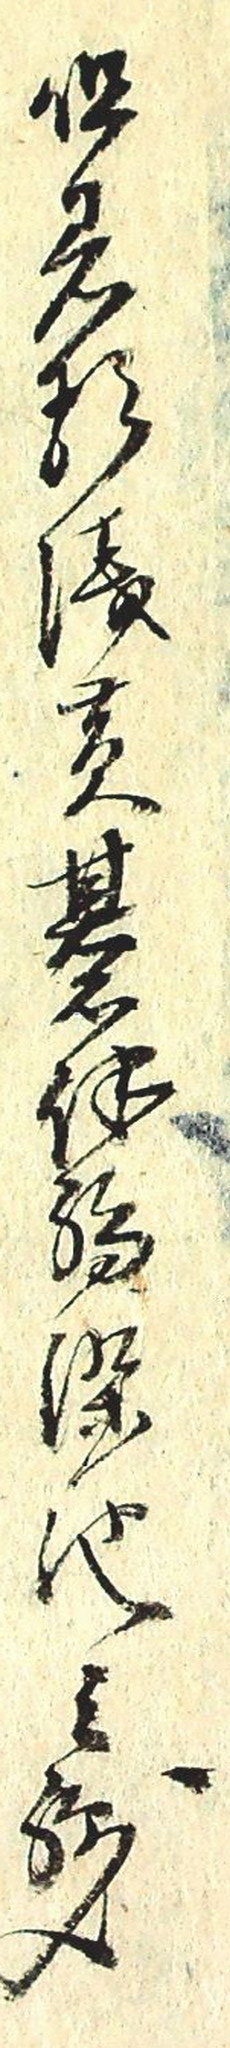但着類浅黄碁伴縞染地之綿入
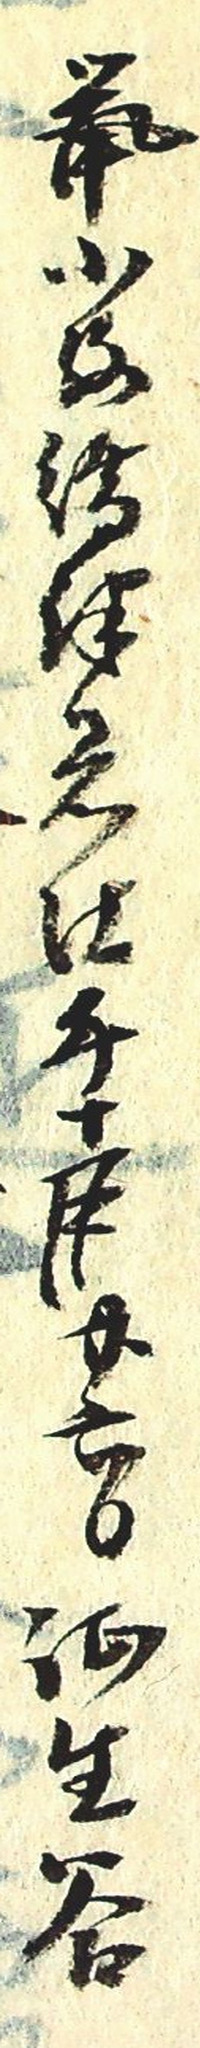鼠小紋襦袢着仕午十月廿六日誕生谷
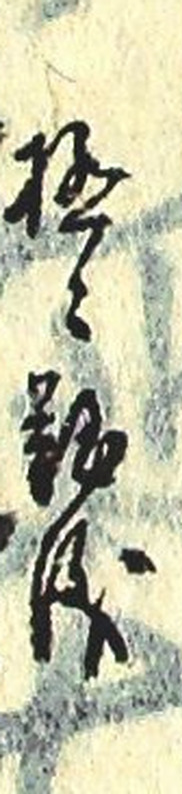極々難儀
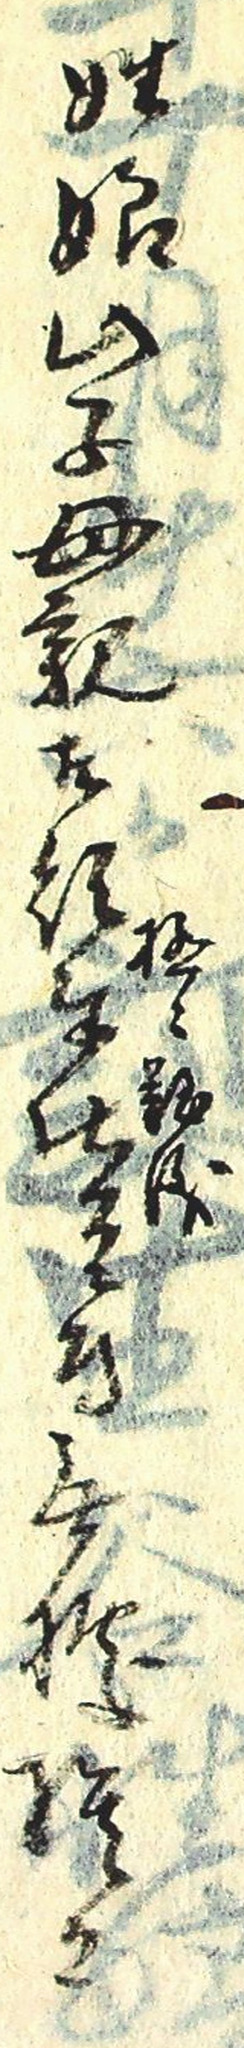姓娘此子母親相煩奉仕候に付無拠捨候
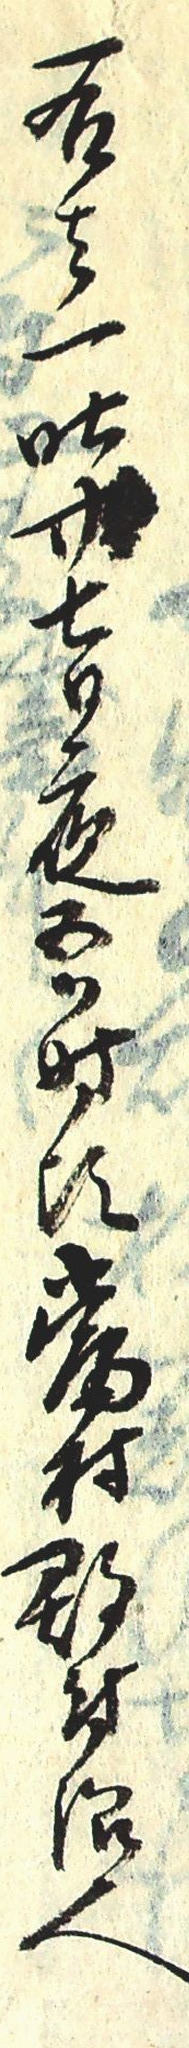右は一昨廿七日夜五つ時頃当村郡付浪人
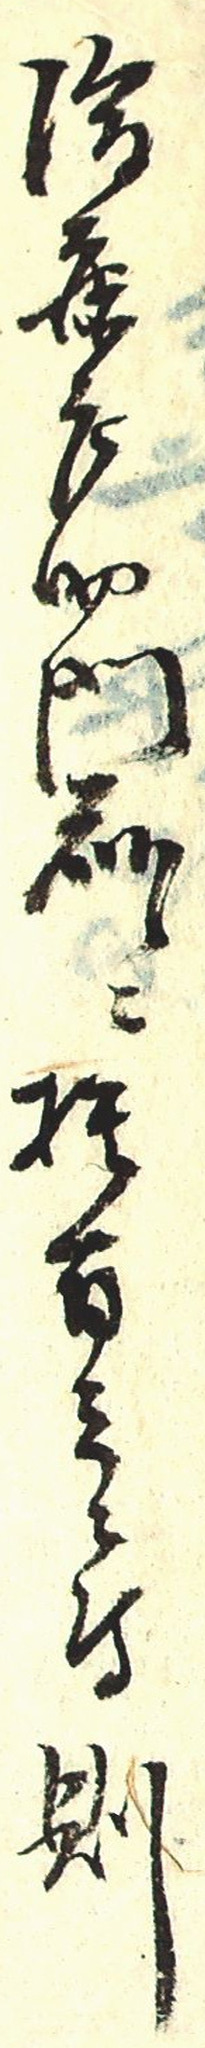後藤庄助門前に捨有之に付則

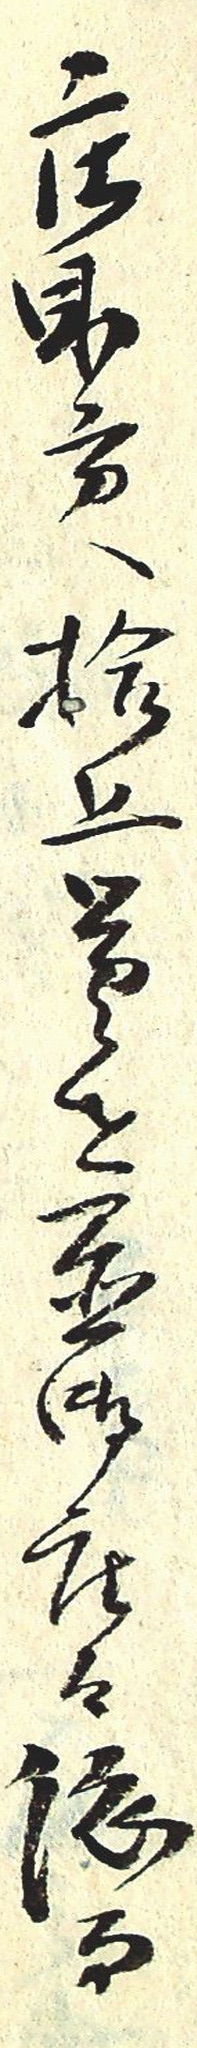庄助方へ拾上労らせ置御座候依て
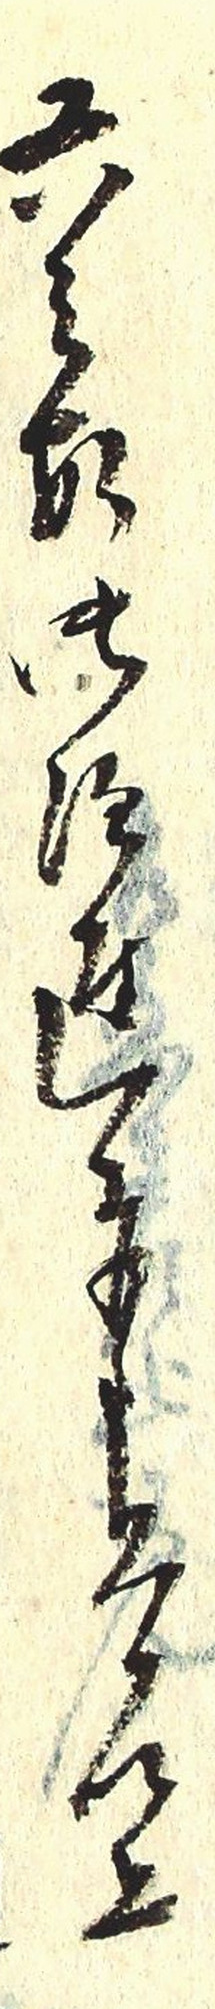右之段御注進奉申上候以上
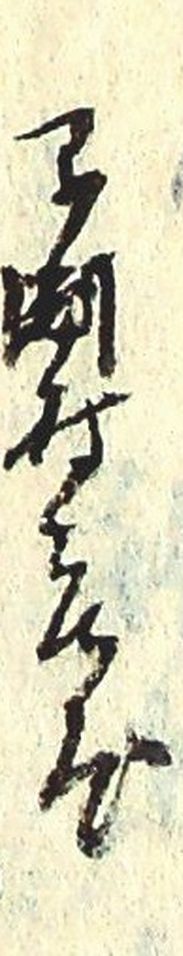早淵村庄屋
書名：諸御願書控(弐番）
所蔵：鳴門教育大学 Naruto University of Education
